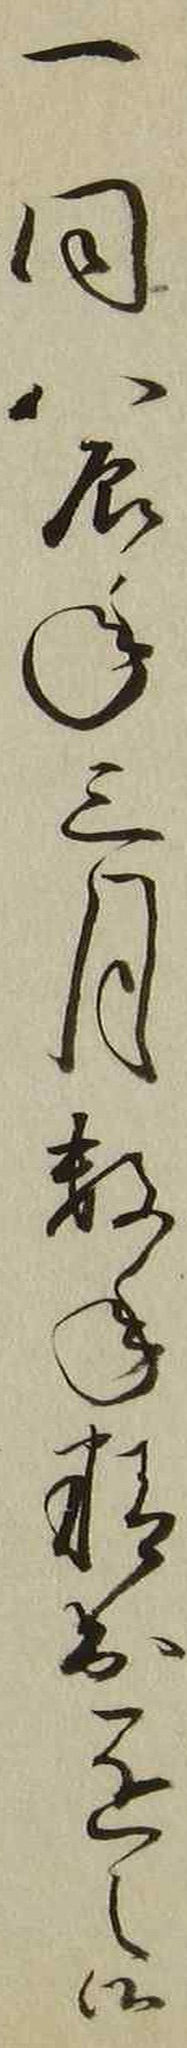一同八辰年三月数年精出懸之御
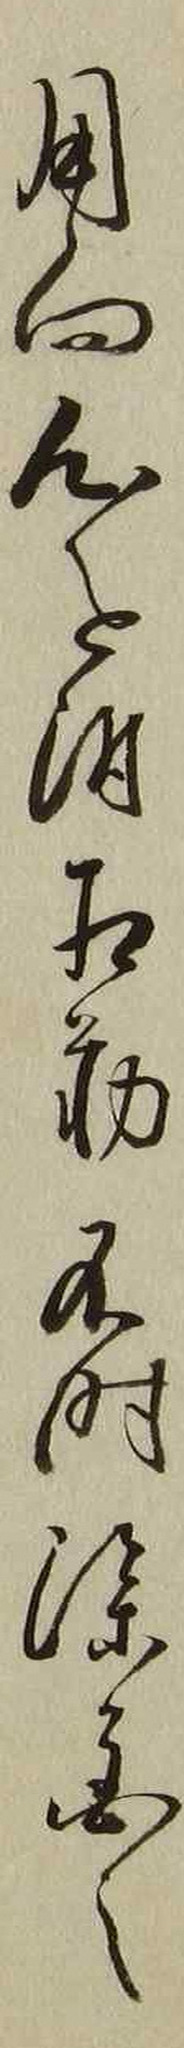用向心を附相勤不時之
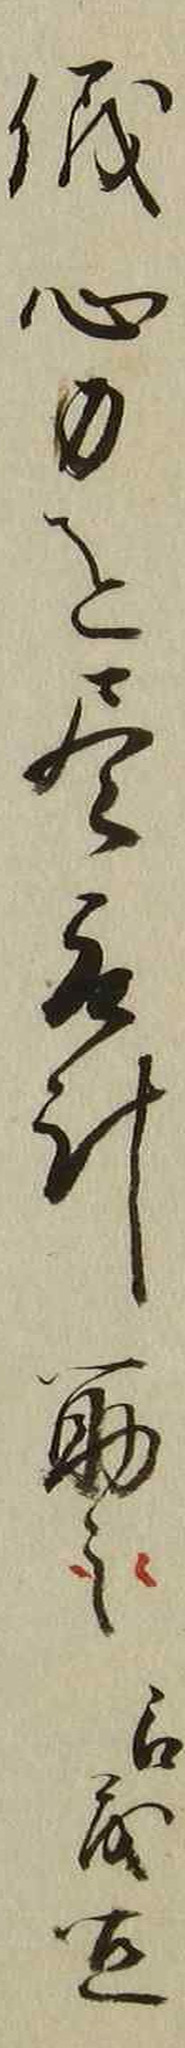儀心力を尽取計筋之江も宜
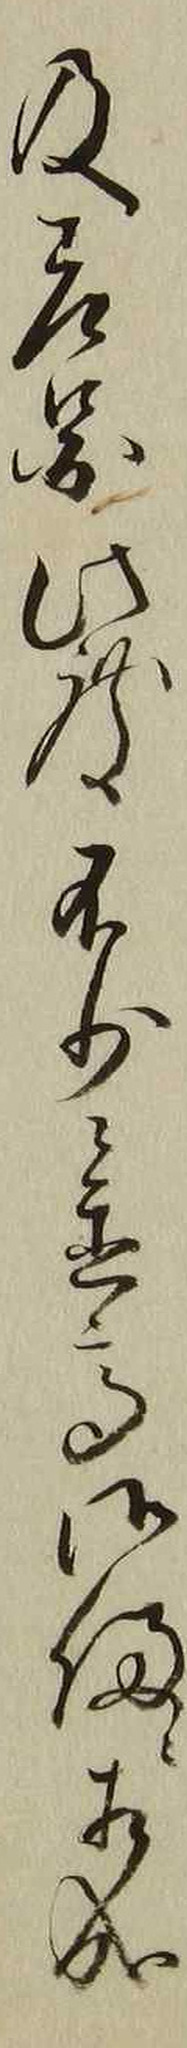及差図此度不少金高御備ニ相成
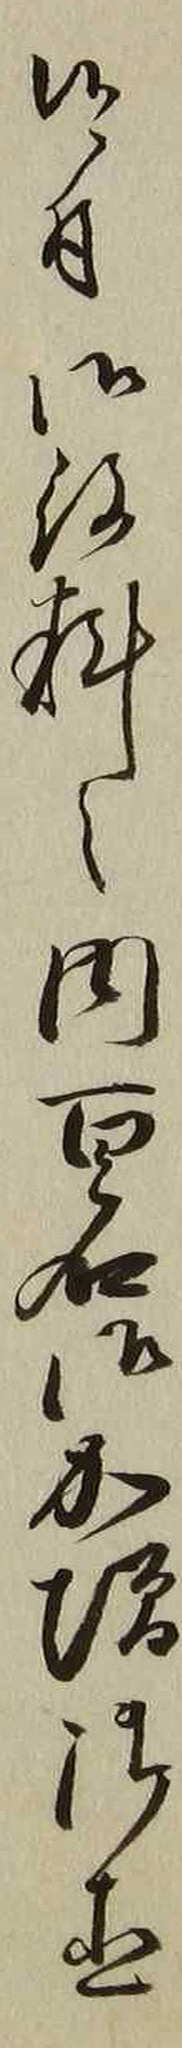候ニ付御役料之内百石御加増御直
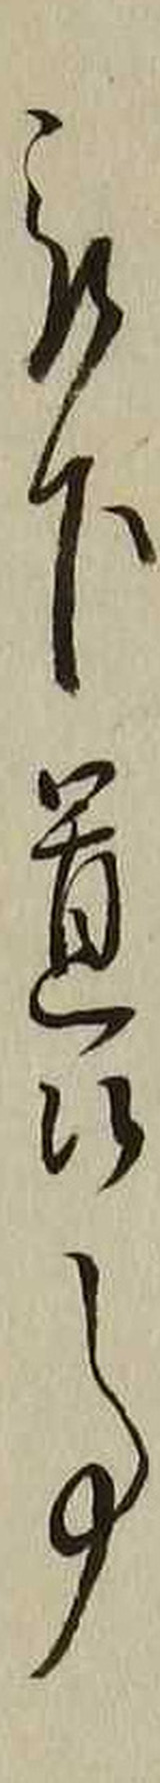被下置候事
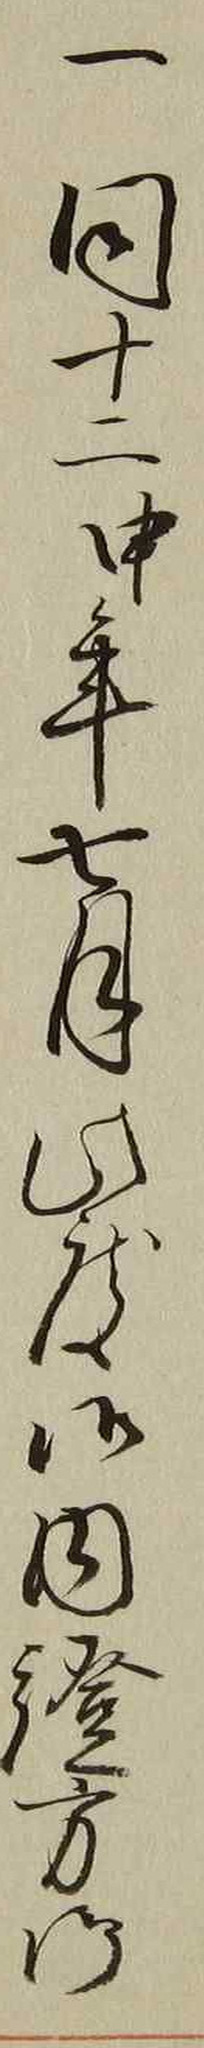一同十二申年七月此度御内証方御
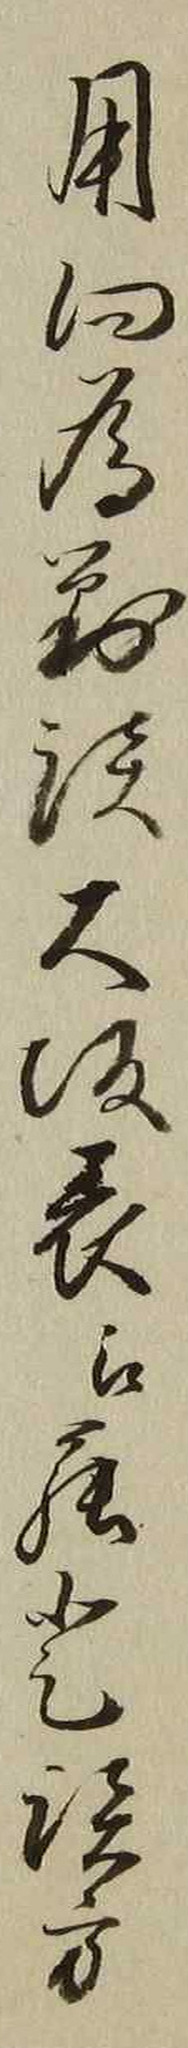用向為対談大坂表江罷登談方
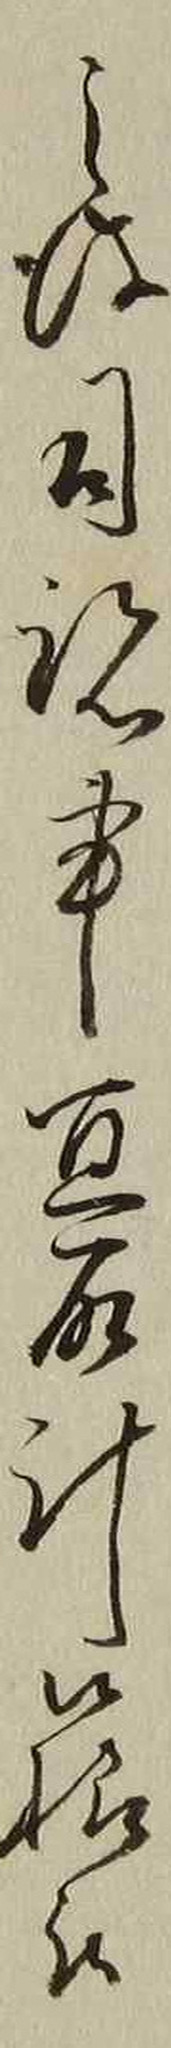之儀司諸事宜取計候様被
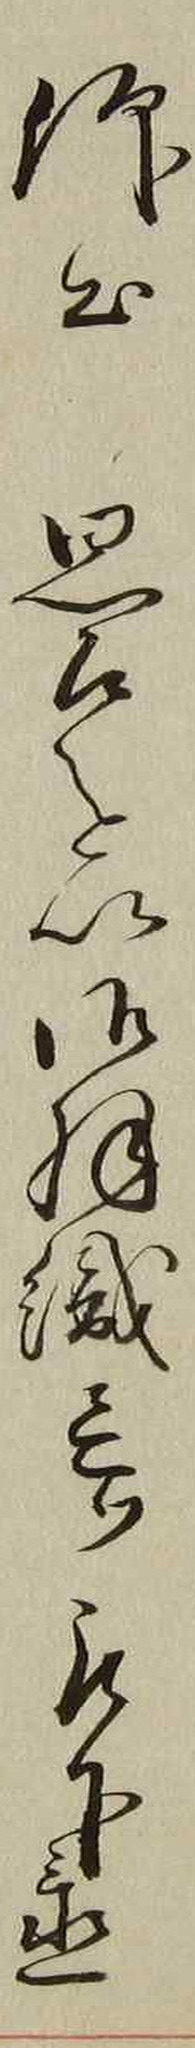仰出思召を以御羽織壱ツ被下置
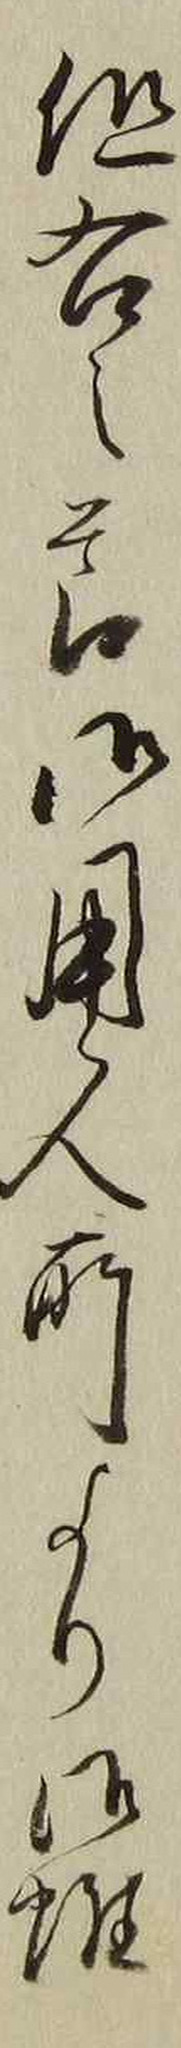但右之節御用人所より御帷
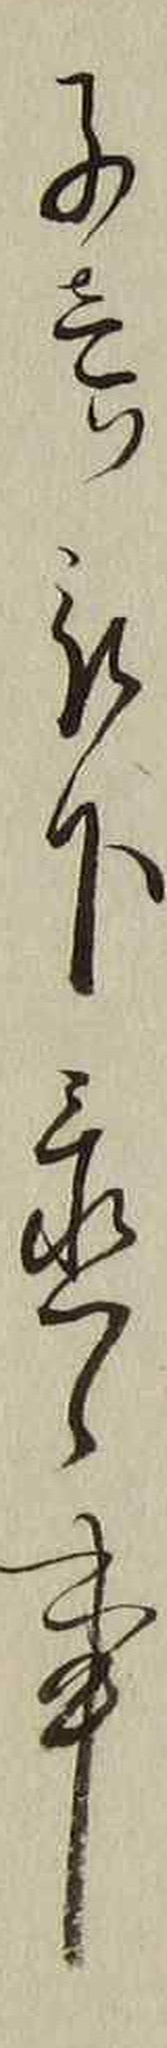子壱ツ被下置候事
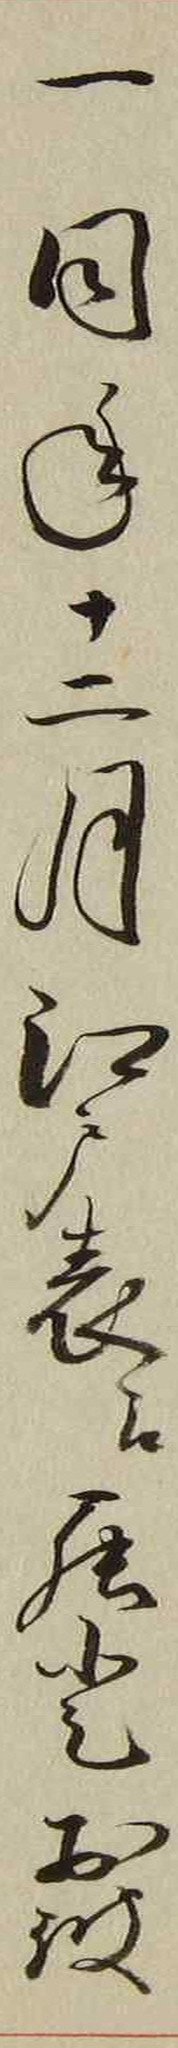一同年十二月江戸表江罷登於彼
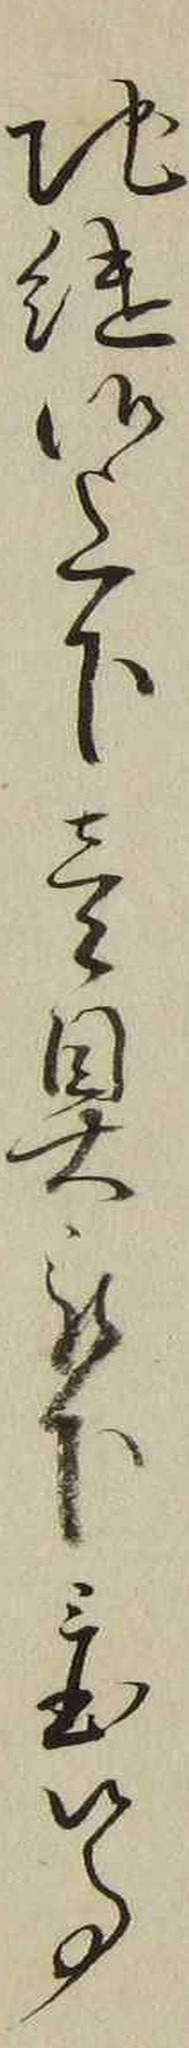地継御上下壱具被下置候事
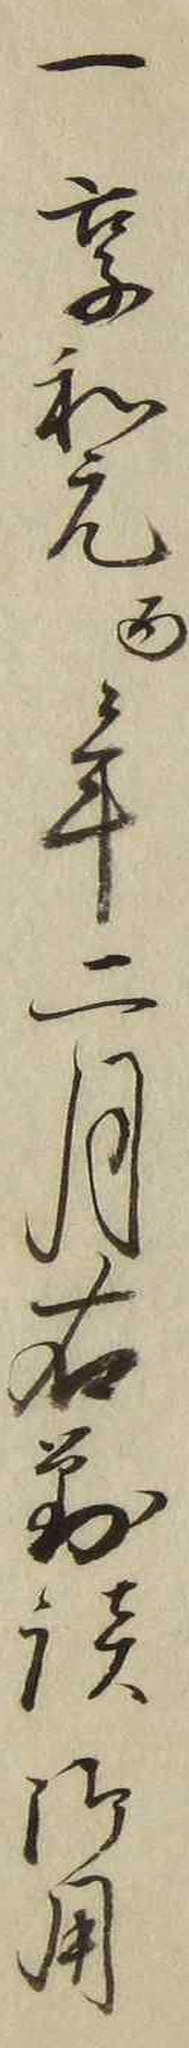一享和元酉年二月右対談御用

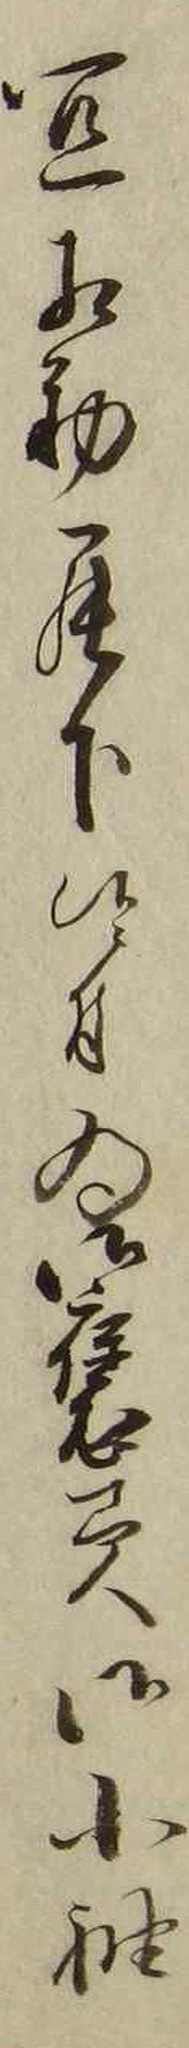宜相勤罷下候ニ付為御褒美御小袖
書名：諸士系譜　巻之2　い之部2
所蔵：会津若松市立会津図書館
